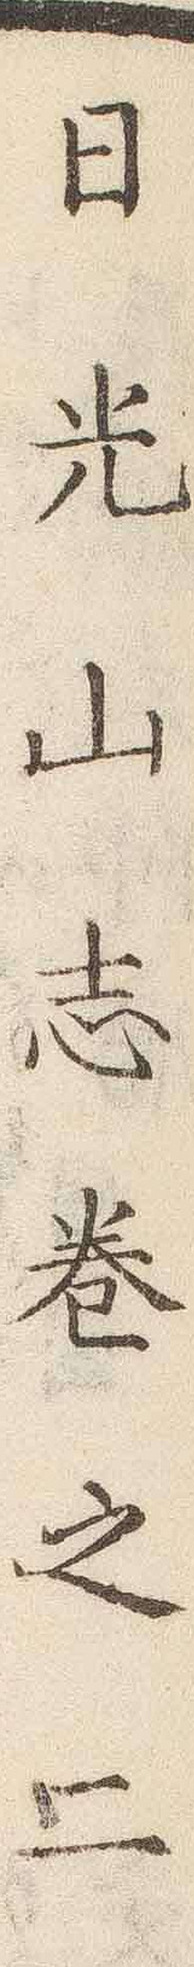日光山志巻之二

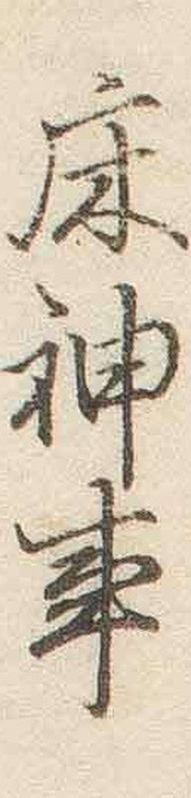床神事

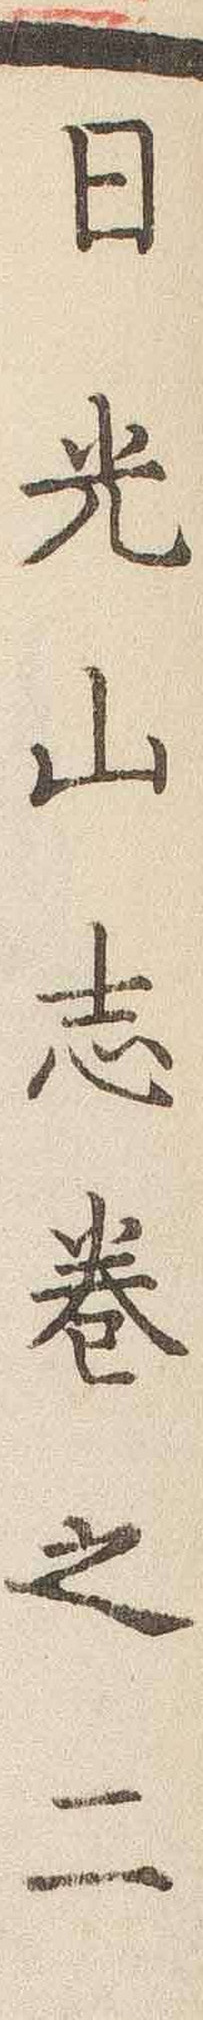日光山志巻之二
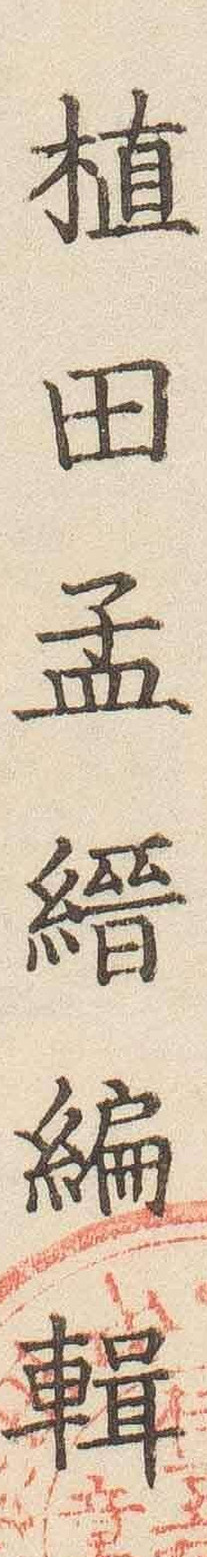植田孟縉編輯
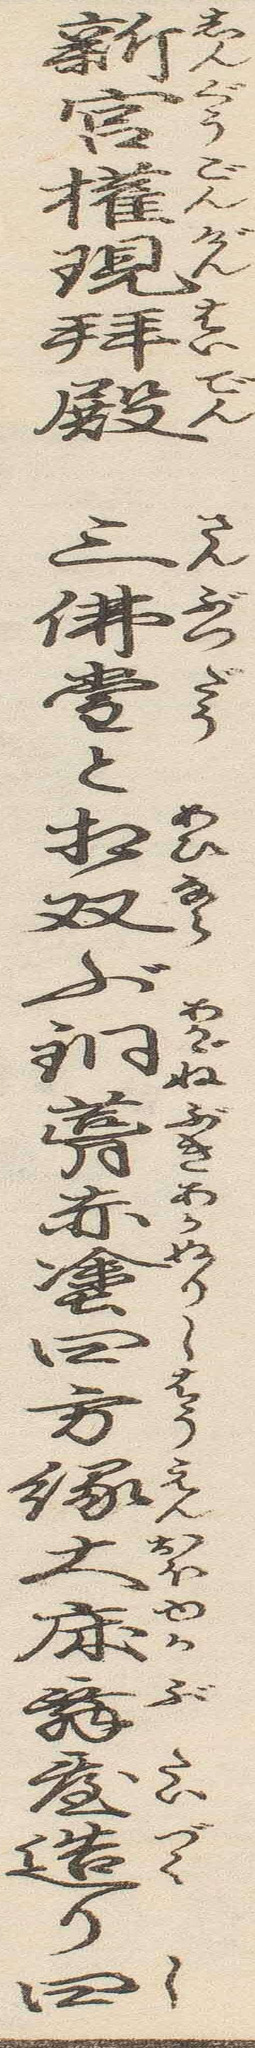新宮權現拜殿三佛堂と相双ぶ銅葺赤塗四方縁大床舞臺造り四
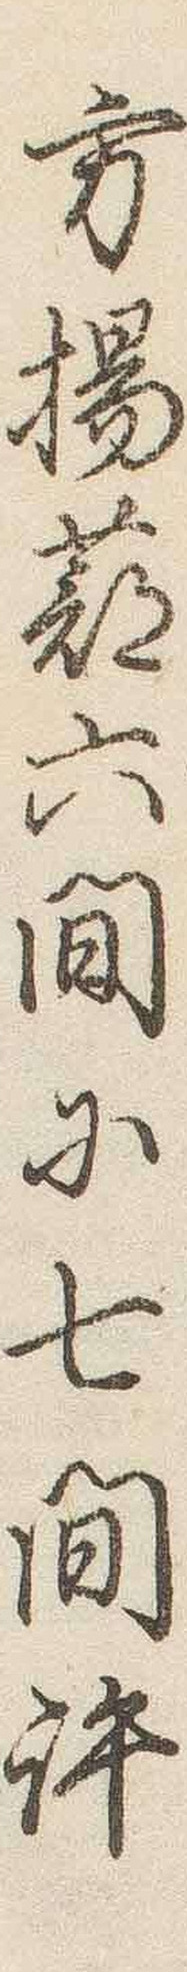方揚蔀六間に七間許
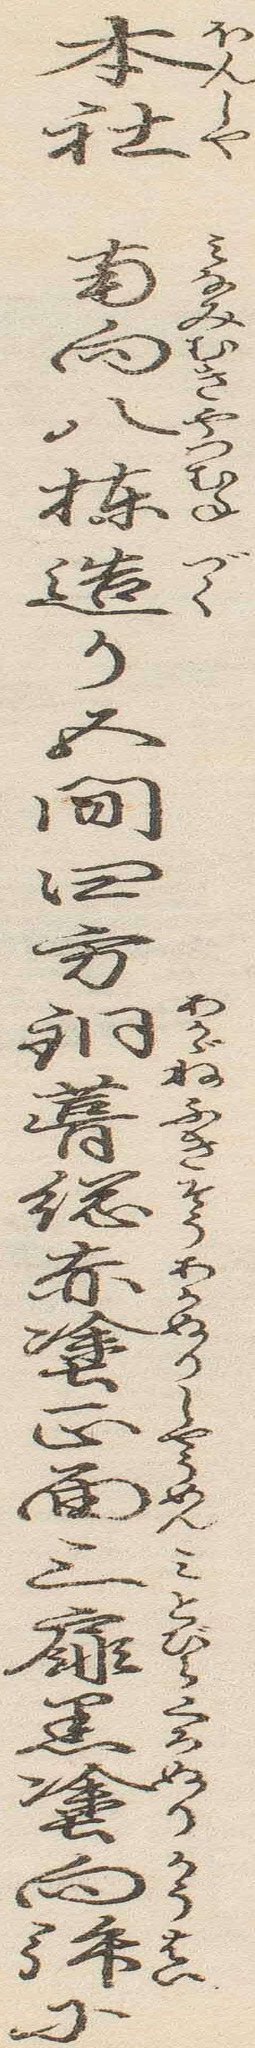本社南向八棟造り五間四方銅葺総赤塗正面三扉黒塗向拜に
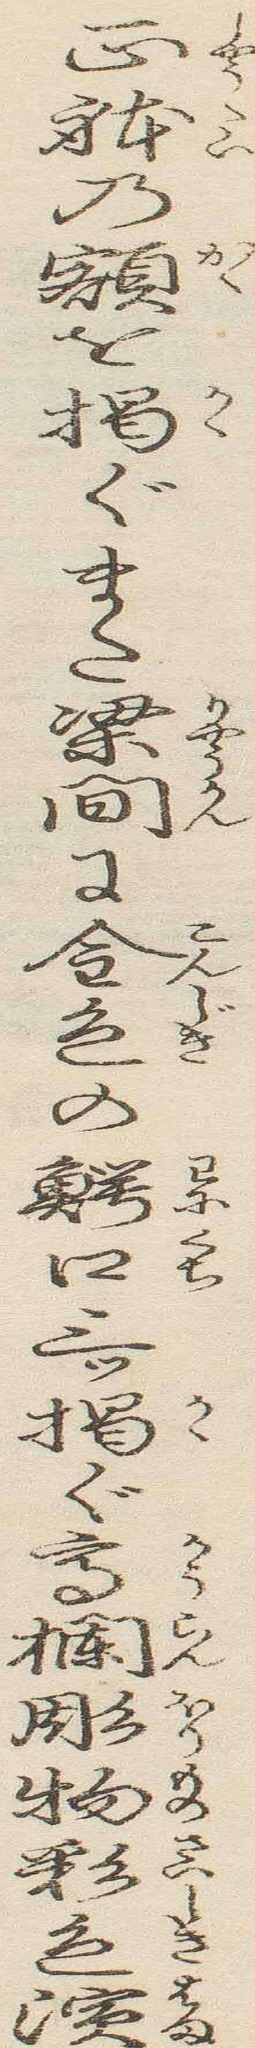正躰の額を掲ぐまた梁間に金色の鰐口三ッ掲ぐ高欄彫物彩色濱
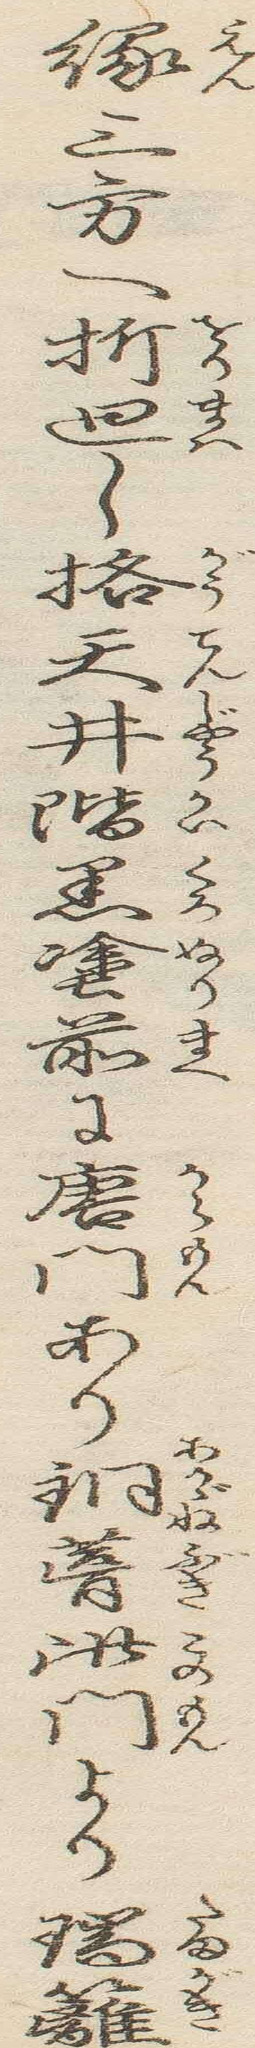縁三方へ折廻し格天井階黒塗前に唐門あり銅葺此門より瑞籬
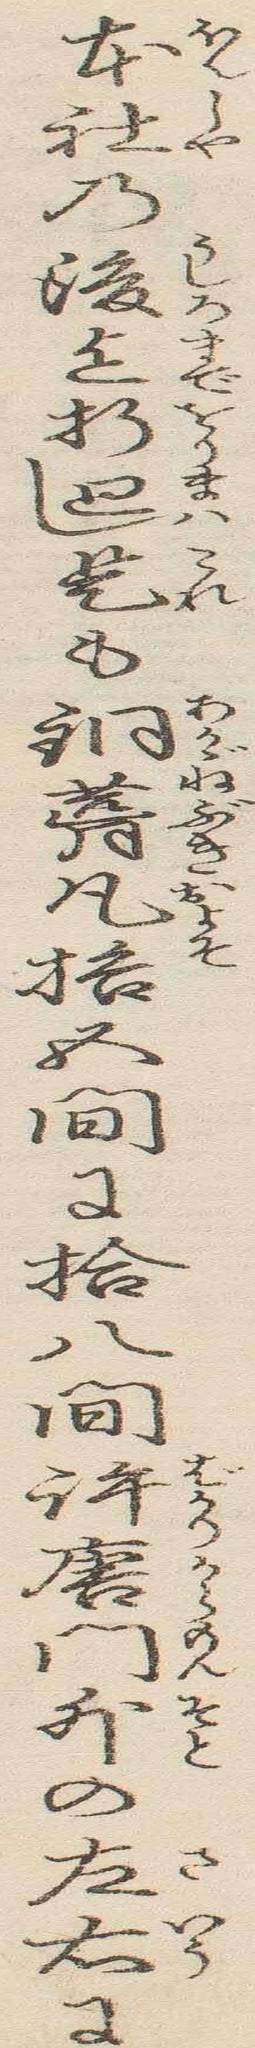本社の後迄折廻し是も銅葺凡拾五間に拾八間許唐門外の左右に
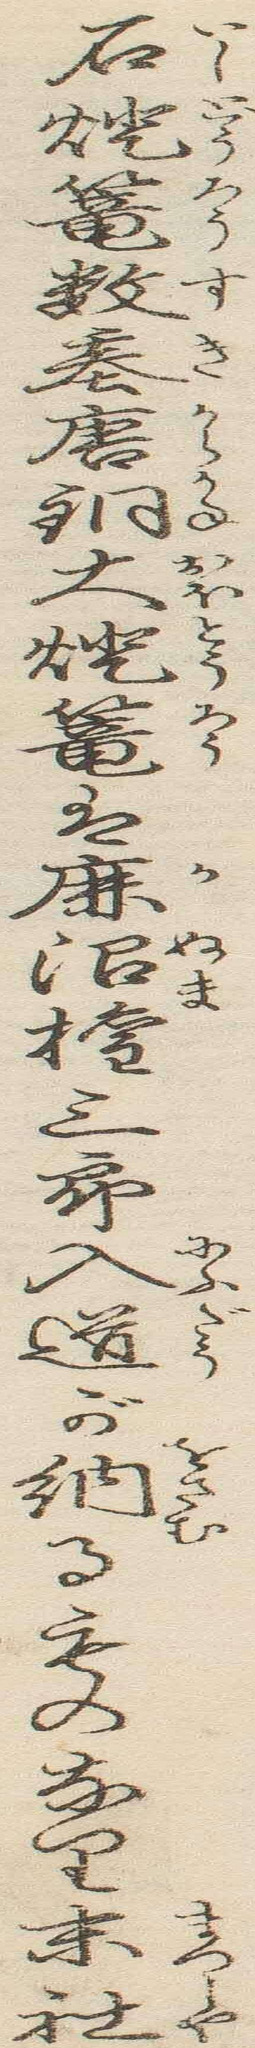石燈籠数基唐銅大燈籠は鹿沼權三郞入道が納るものなり末社
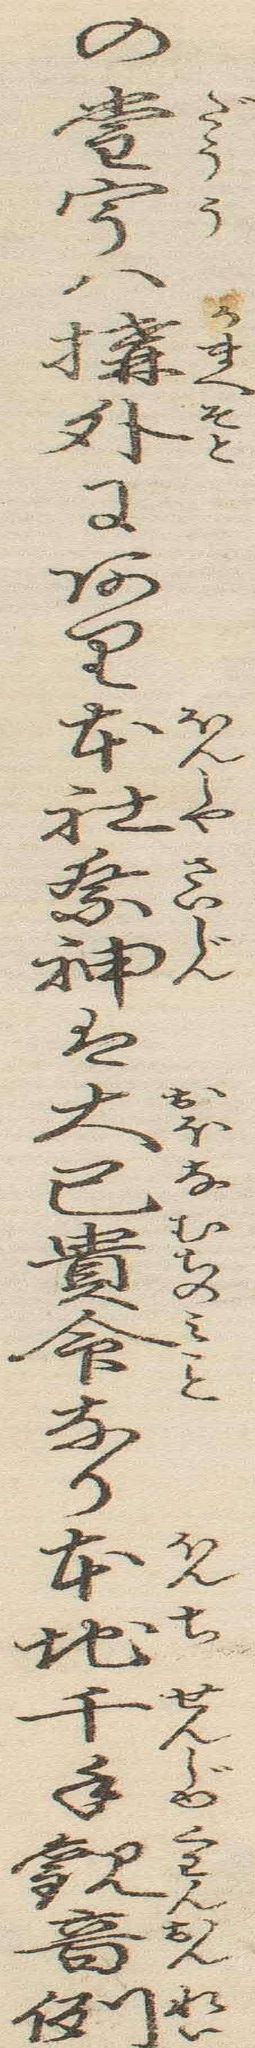の堂宇は構外にあり本社祭神は大己貴命なり本地千手観音例
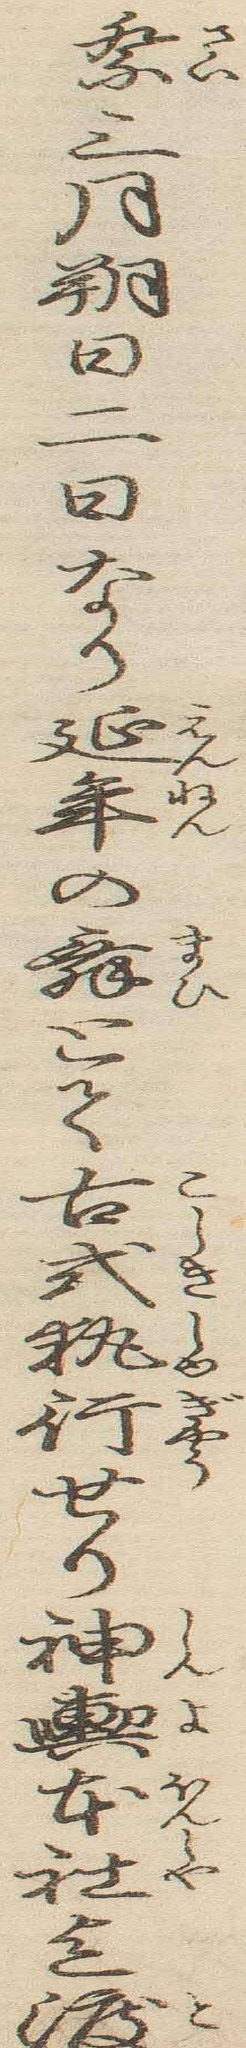祭三月朔日二日なり延年の舞とて古式執行せり神輿本社迄渡

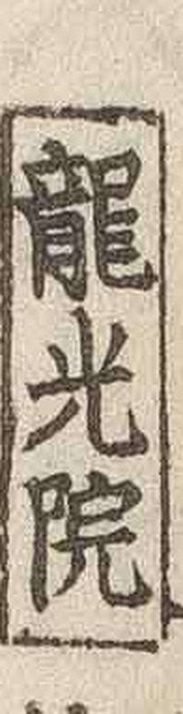龍光院
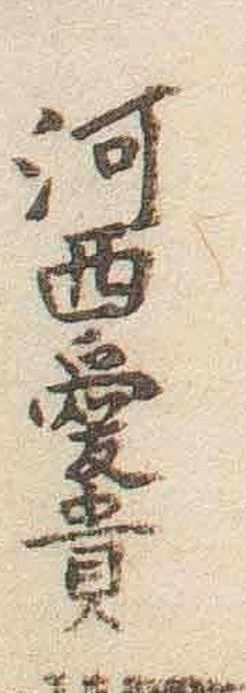河西愛貴
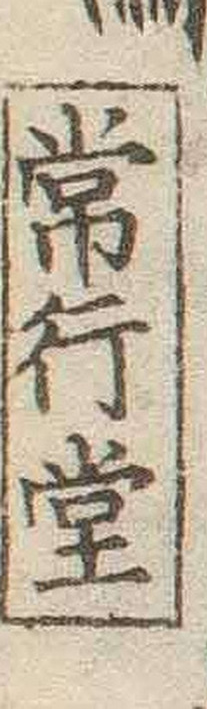常行堂
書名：日光山志
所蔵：東京学芸大学附属図書館 国文学研究資料館
